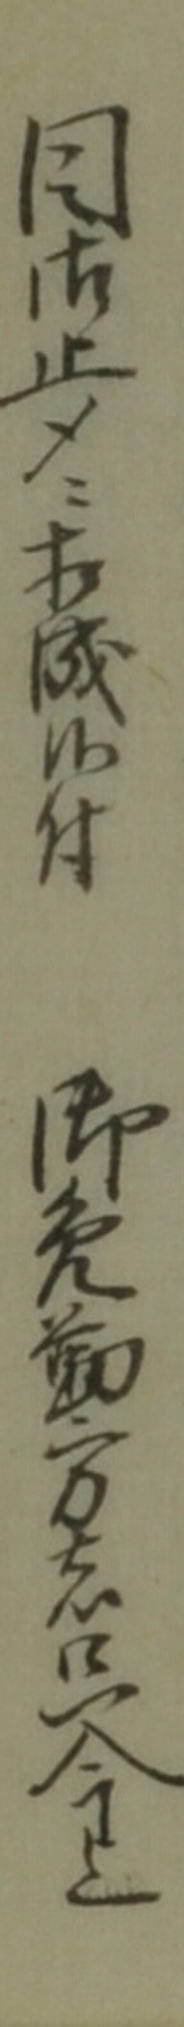目御止メニ相成候付御免勤方者只今迄
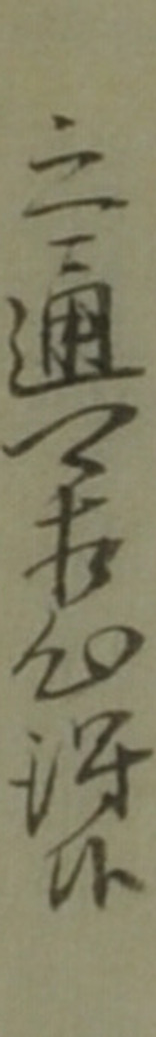之通可相心得候
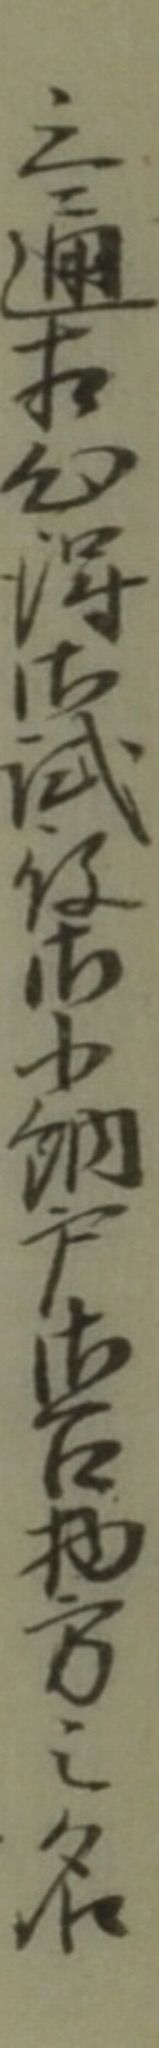之通相心得御試役御小納戸御召物方之名
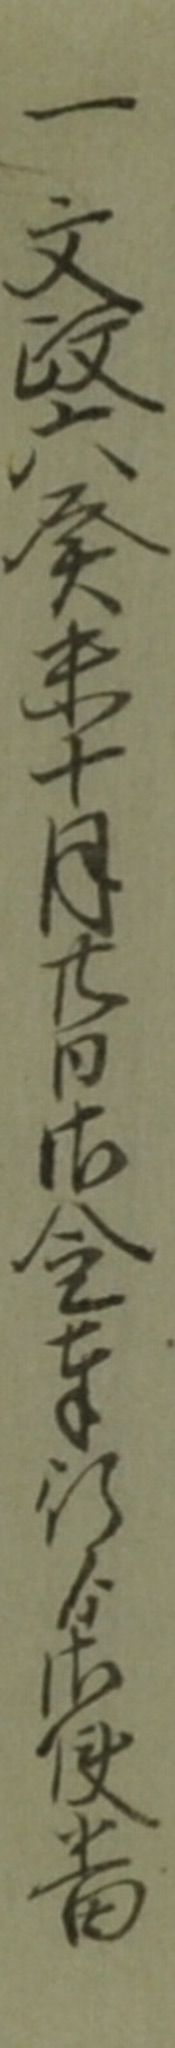一文政六癸未十月廿日御金奉行ゟ御使番
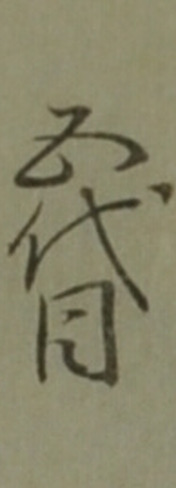五代目
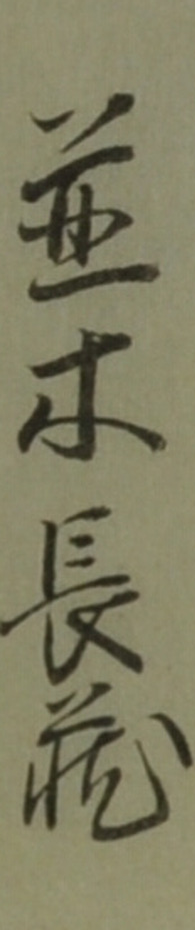並木長蔵
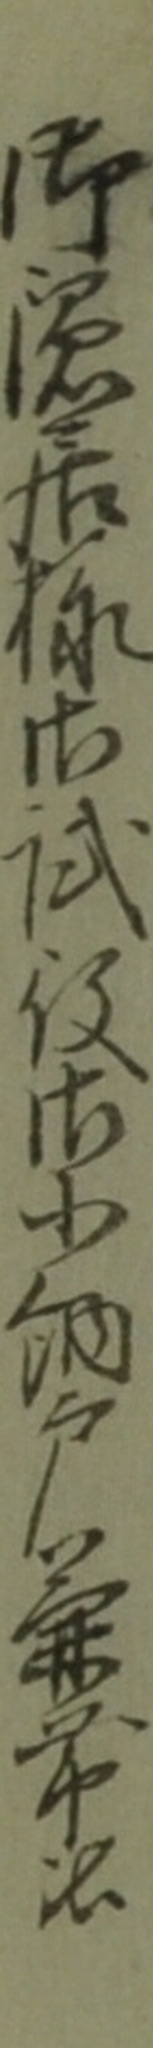御隠居様御試役御小納戸兼帯被
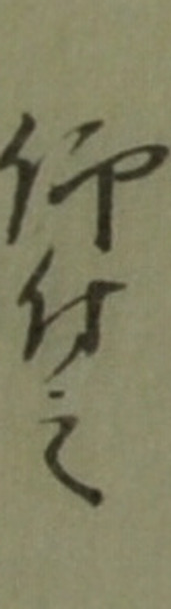仰付之
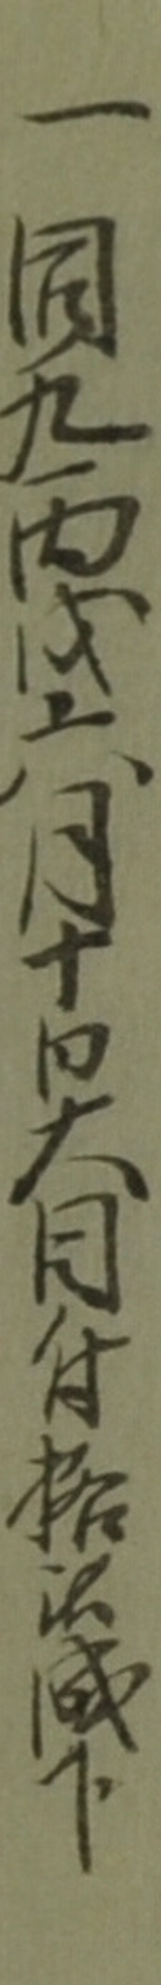一同九丙戌六月十日大目付格被成下
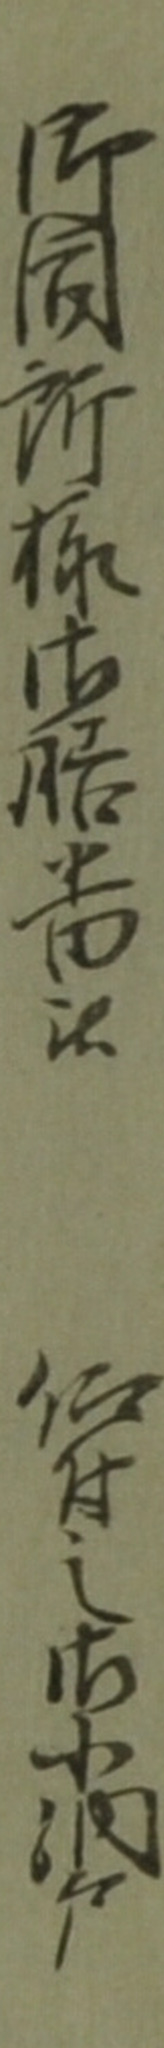御同所様御膳番被仰付之御小納戸
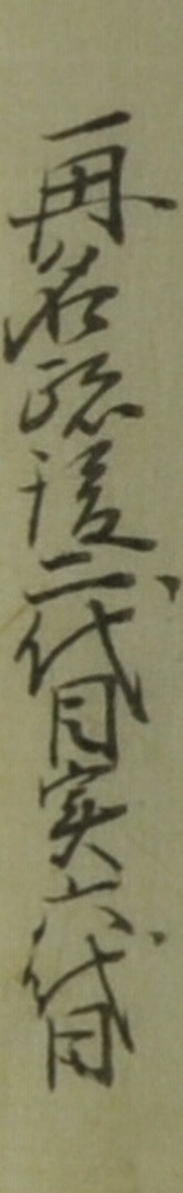再名跡後二代目実六代目

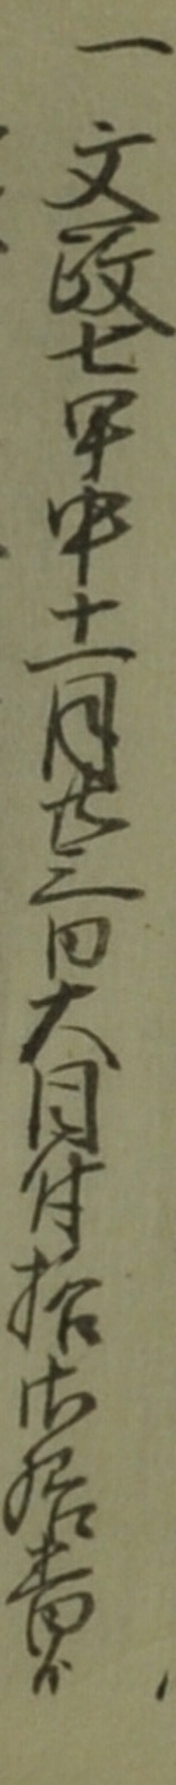一文政七甲申十一月廿三日大目付格御膳番ゟ
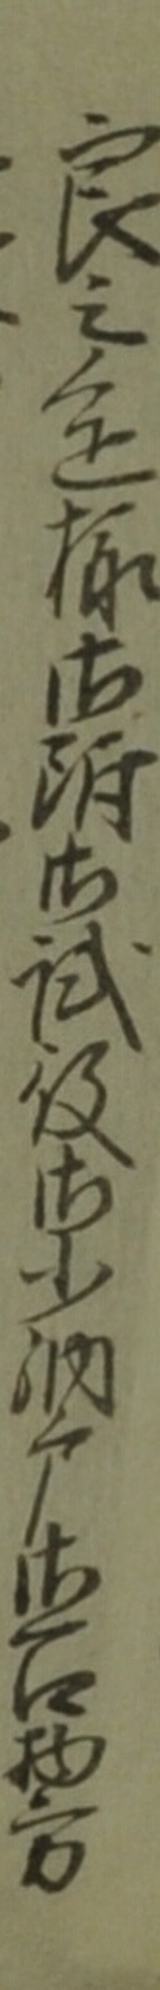良之進様御附御試役御小納戸御召物方
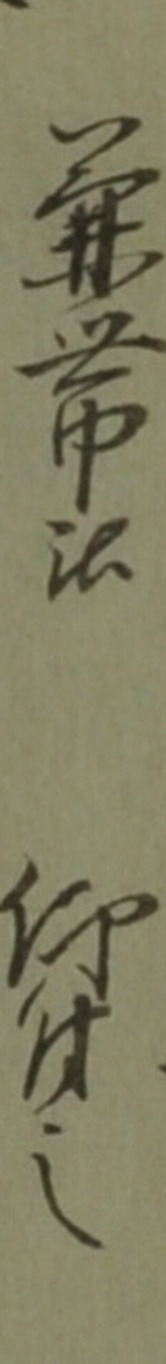兼帯被仰付之
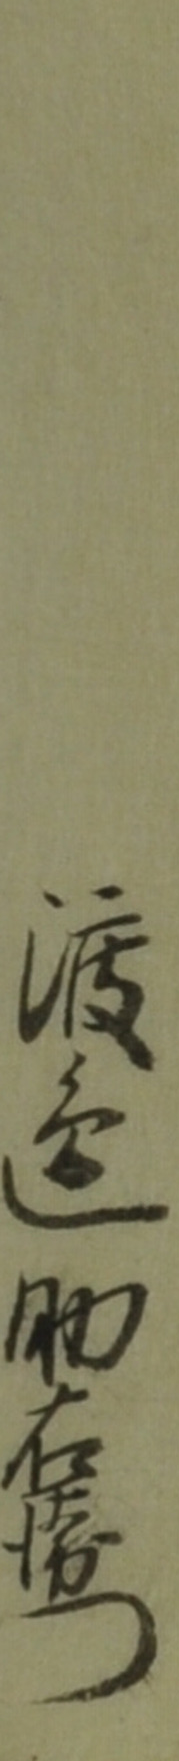渡辺助右衛門
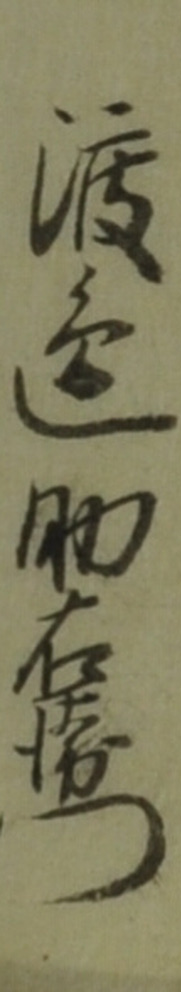渡辺助右衛門
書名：諸御役代々録（四）
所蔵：伊那市立高遠町図書館・合同会社AMANE
